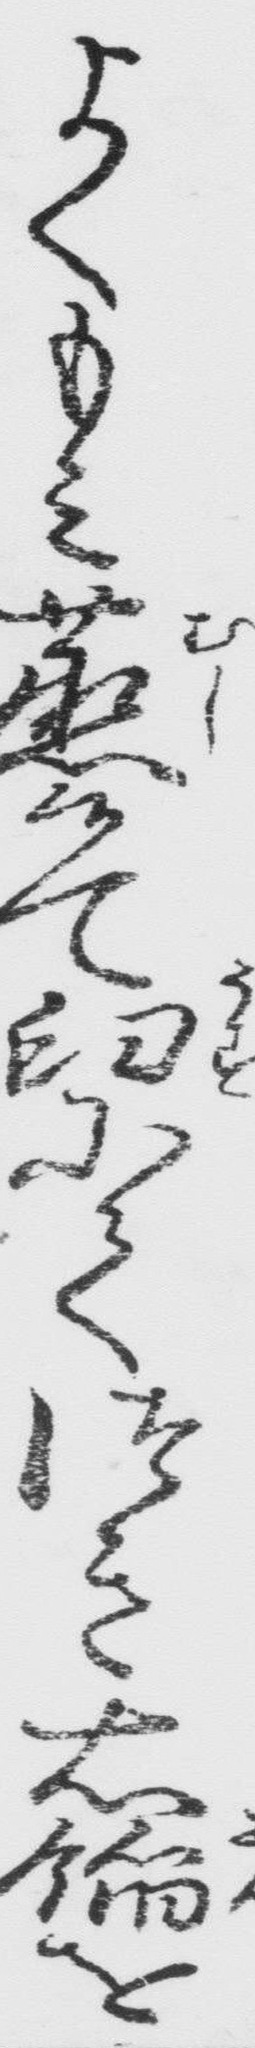よくもみ蒸候て臼にてつき右餡を
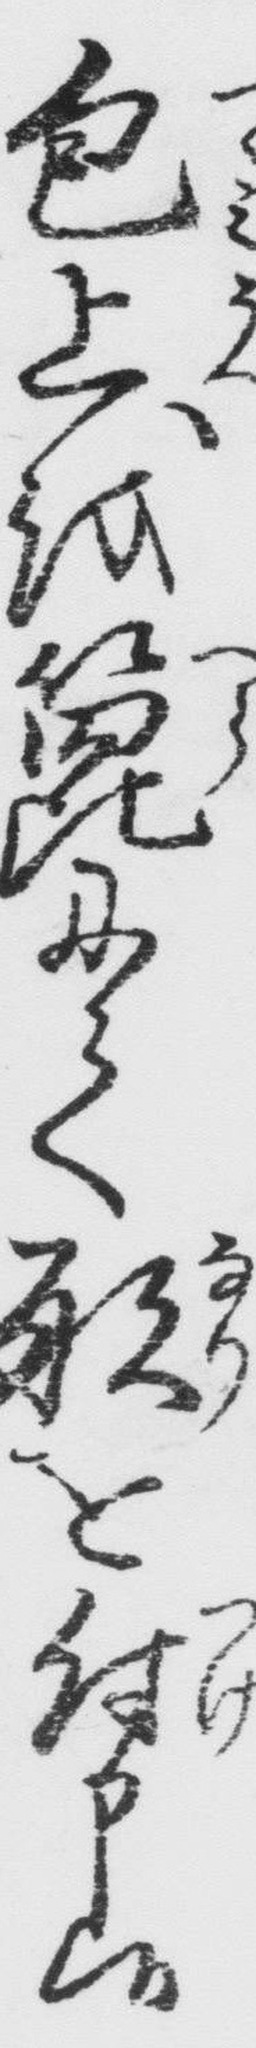包上を箆にて形を付申候

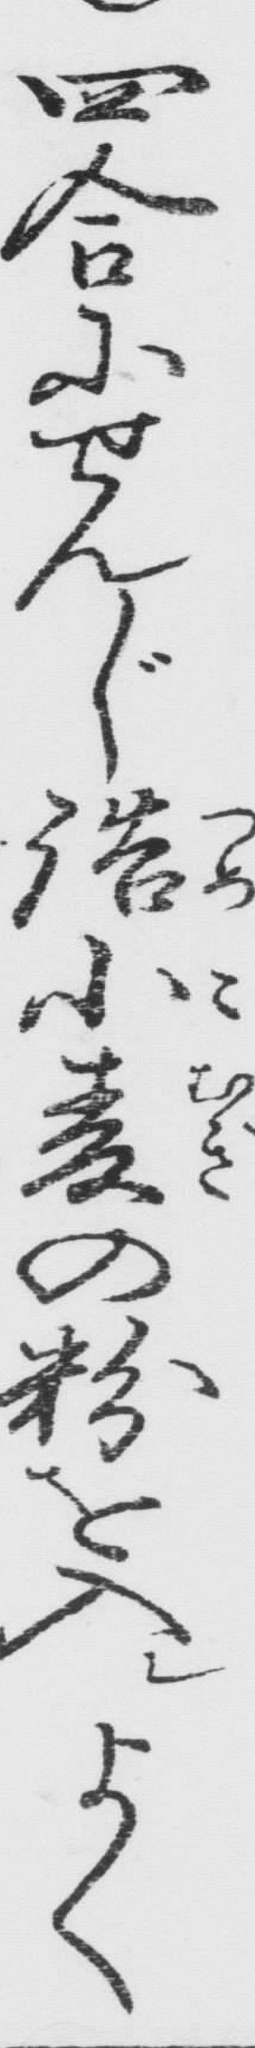四合にせんじ詰小麦の粉を入れよく
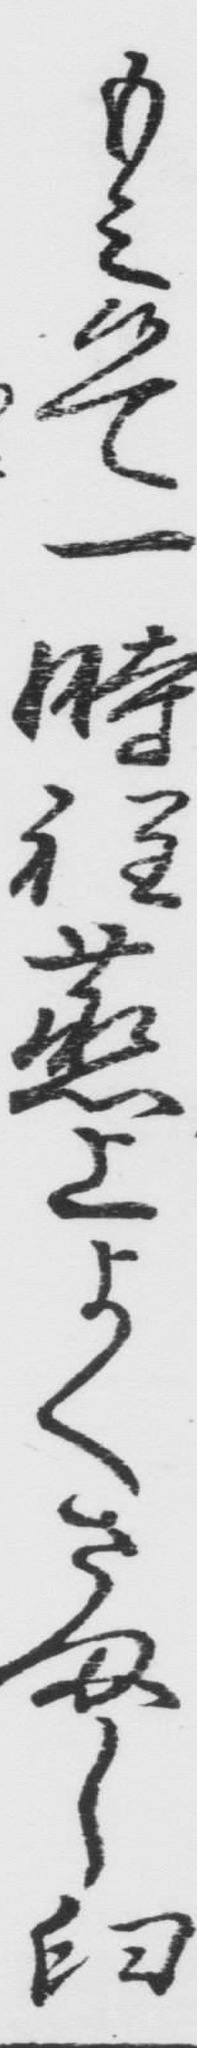もみ候て一時程蒸上よくさまし臼
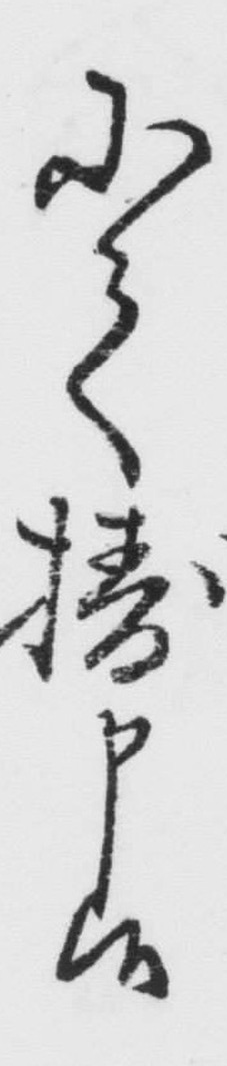にて擣申候
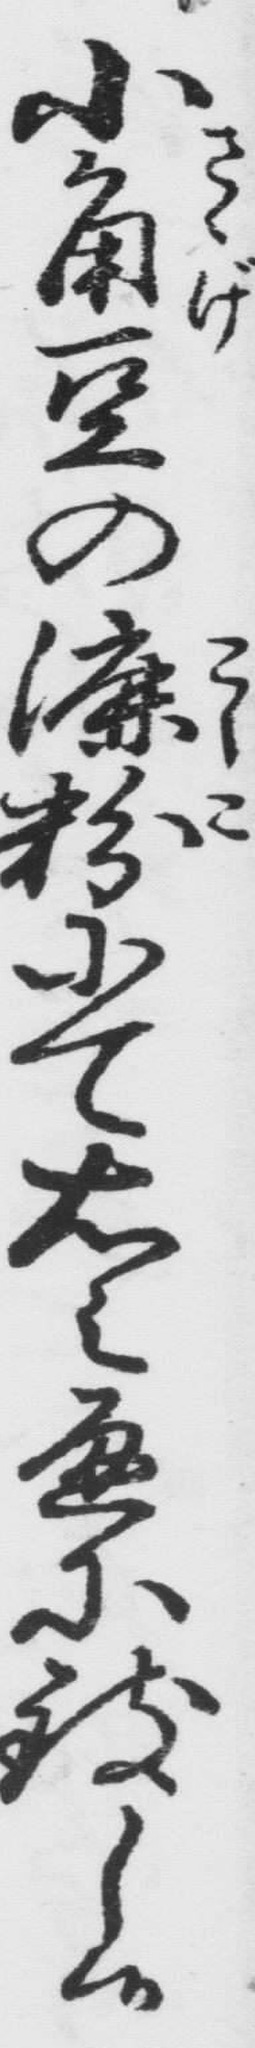小角豆の漉粉にて右之通に致し候
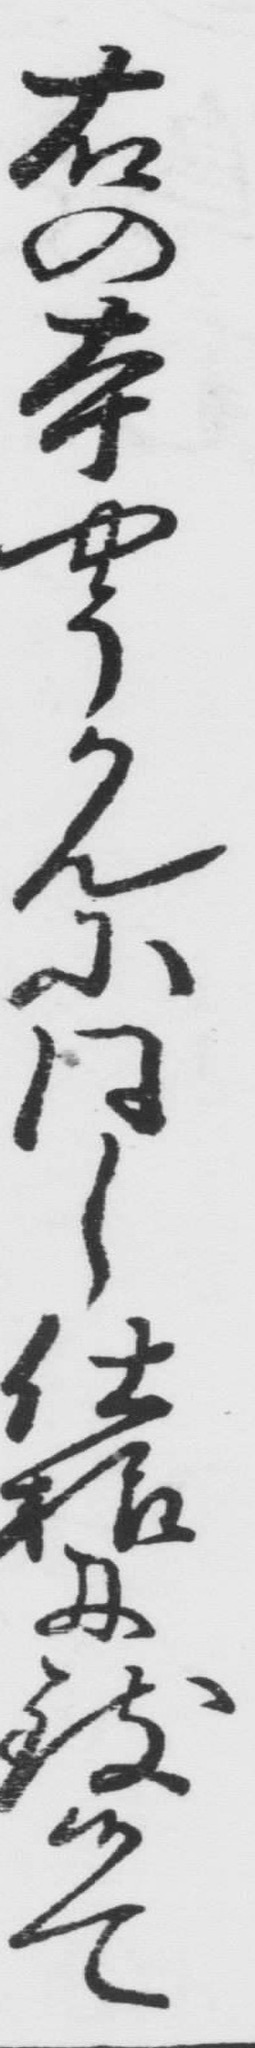右の本やうかんに同し仕様に致候て
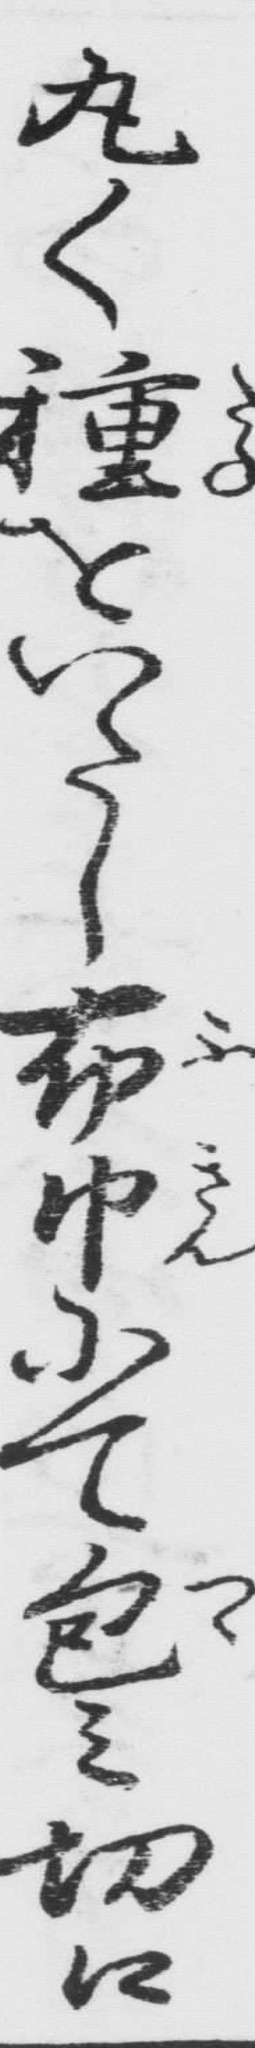丸く種をいたし付近にて包み切口
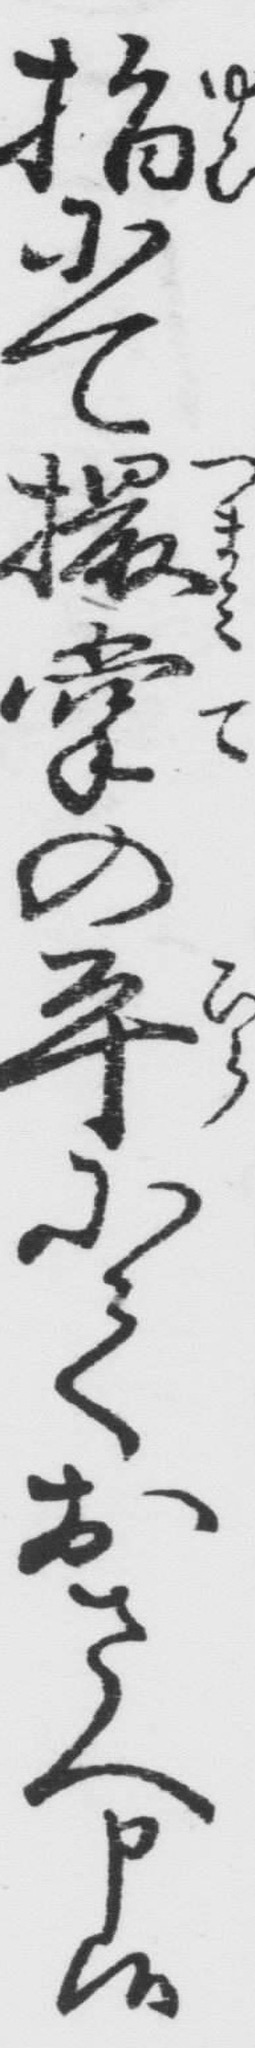指にて撮掌の平にておさへ申候

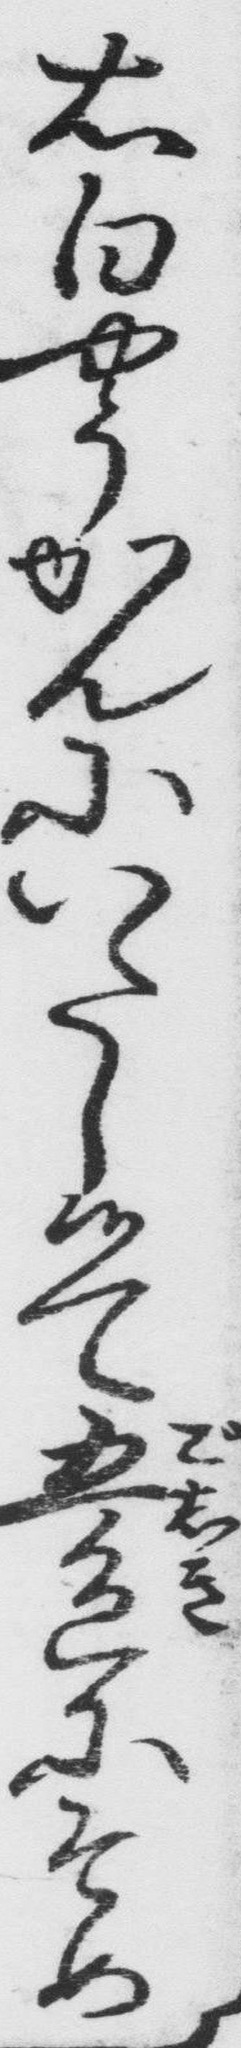右白やうかんにいたし候て五色にそめ
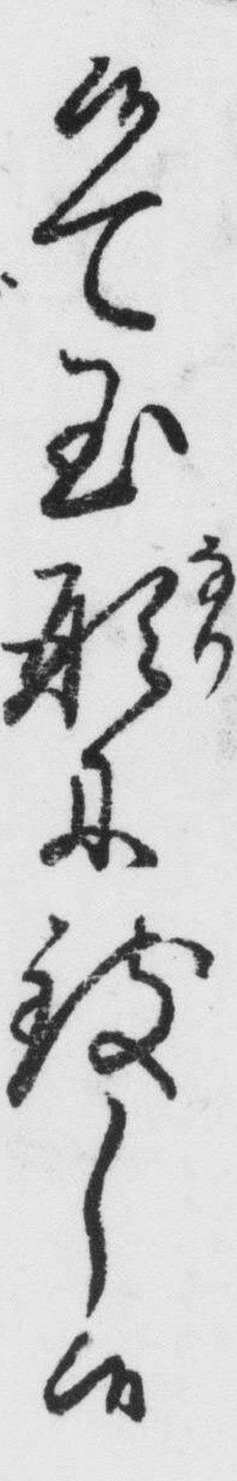候て玉形に致し候
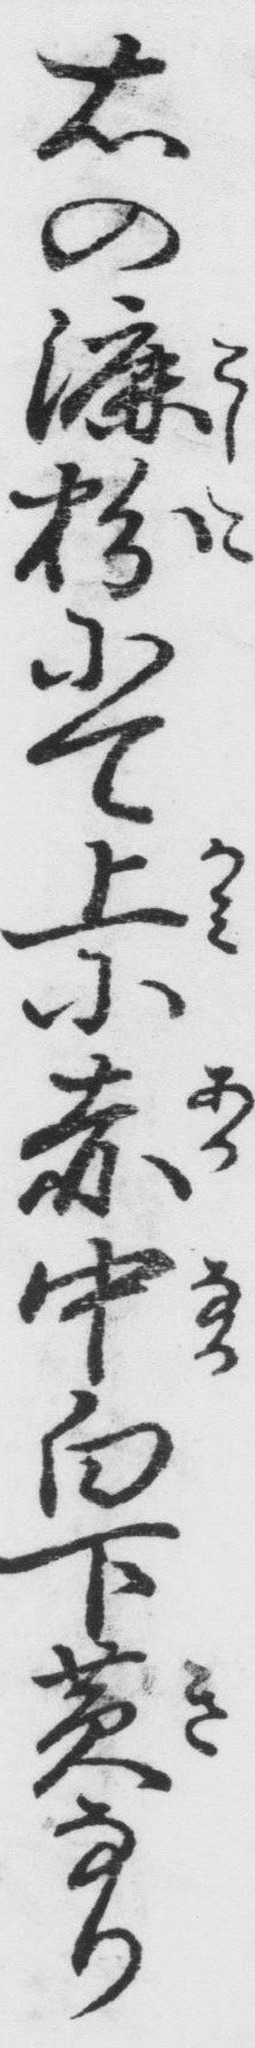右の漉粉にて上に赤中白下黄なり
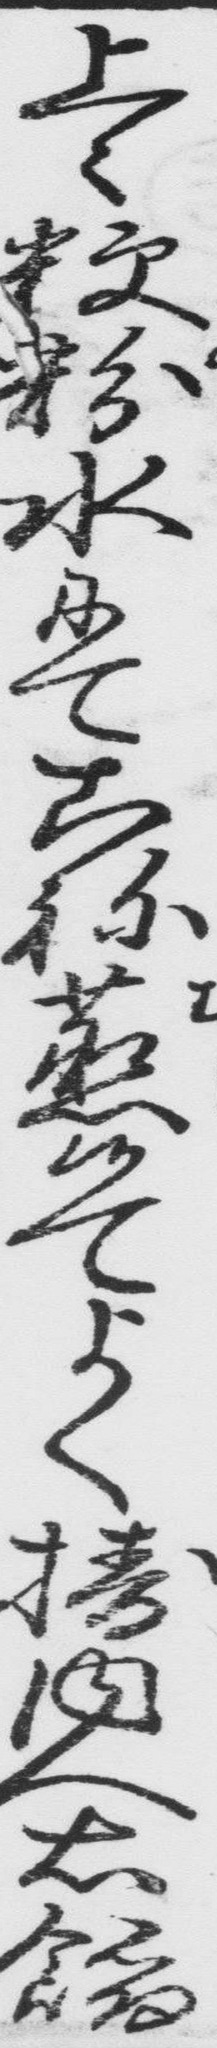上々粳粉水にてこね蒸候てよく擣内へ右餡
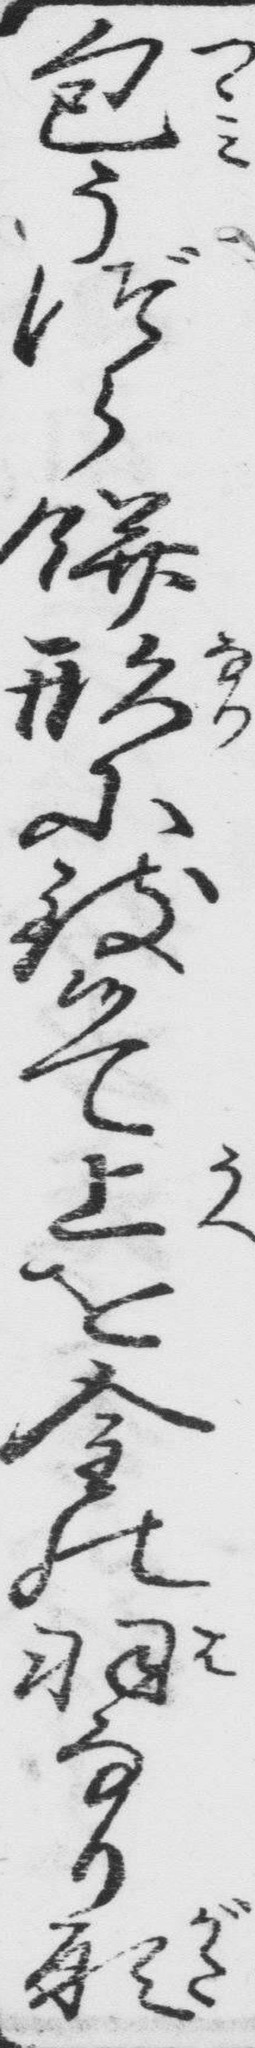包うづら餅形に致候て上を金の羽なり形
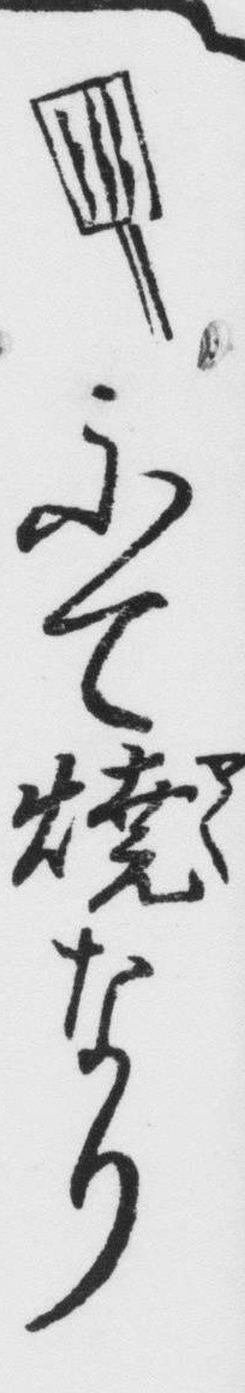にて焼なり
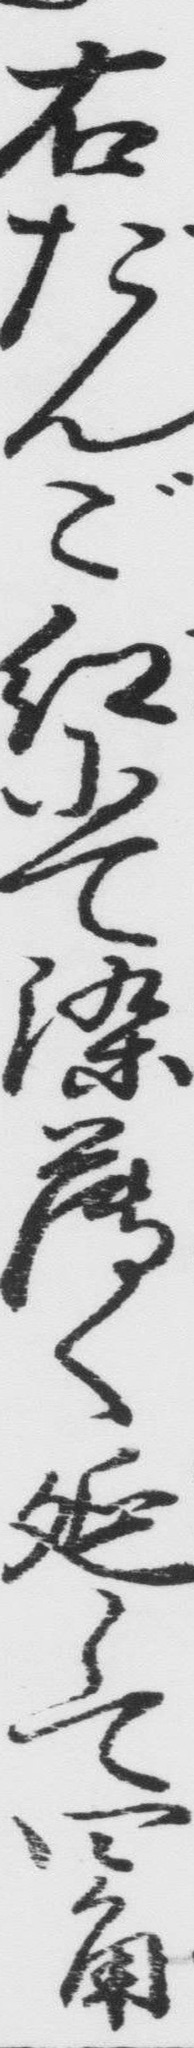右だんご紅にて染薄く延して四角
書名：御前菓子図式
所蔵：大阪府立大学学術情報センター 国文学研究資料館
